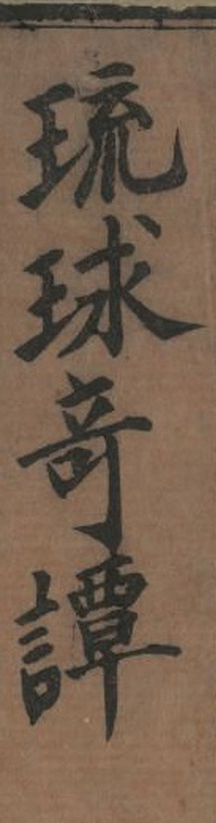琉球奇譚

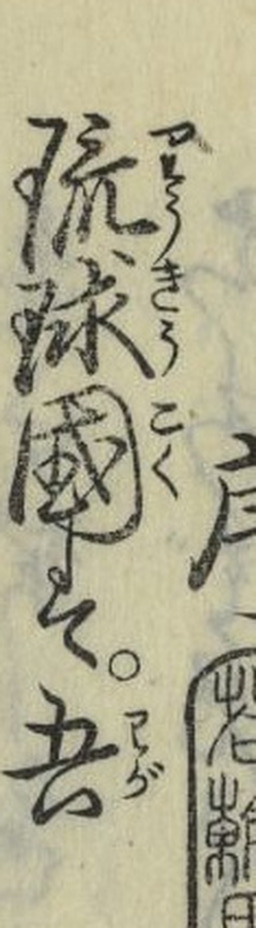琉球国は吾
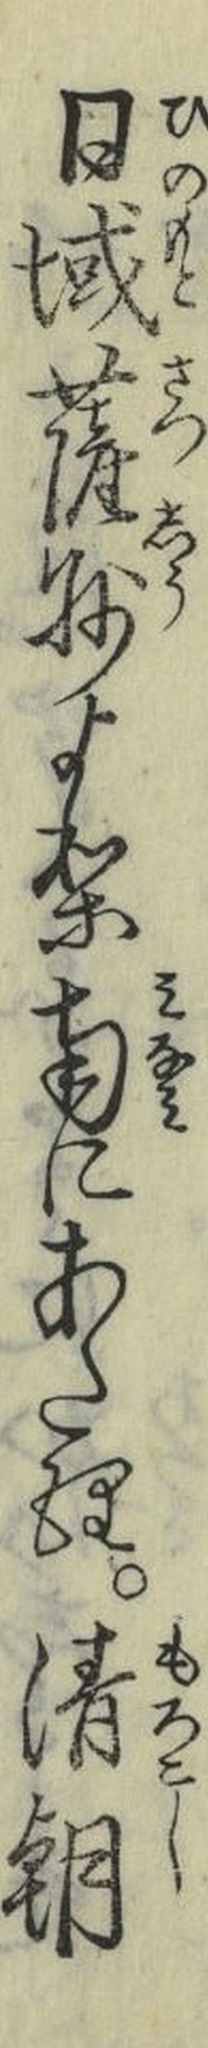日域薩州より南にあたり。清朝
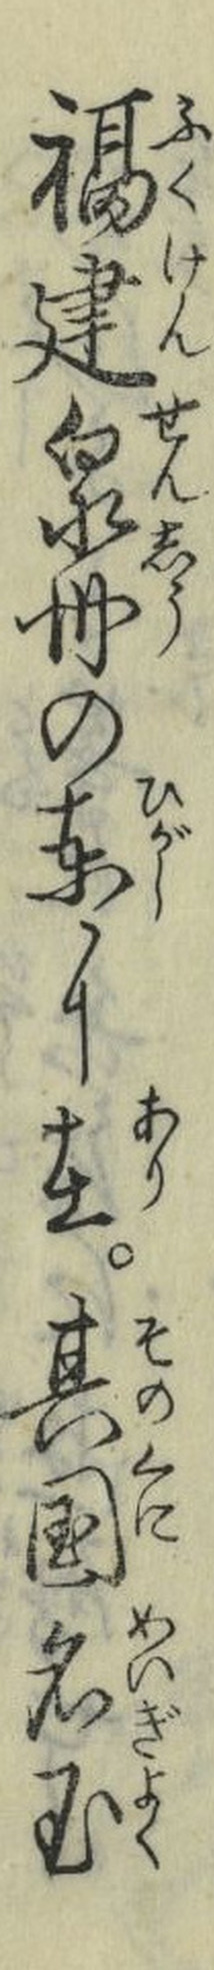福建泉州の東に在。其国名玉
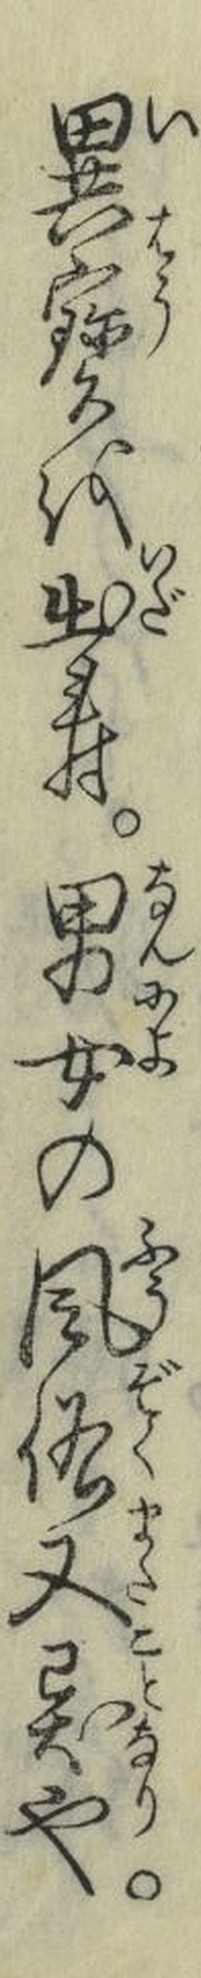異宝を出す。男女の風俗又異や。
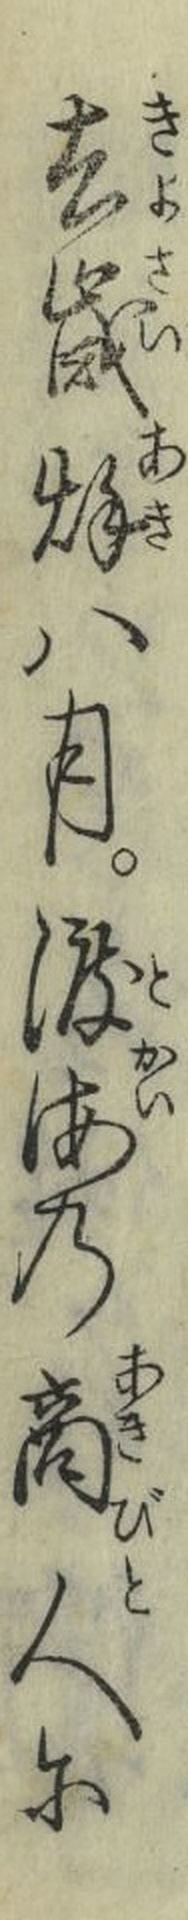去歳秋八月。渡海の商人に

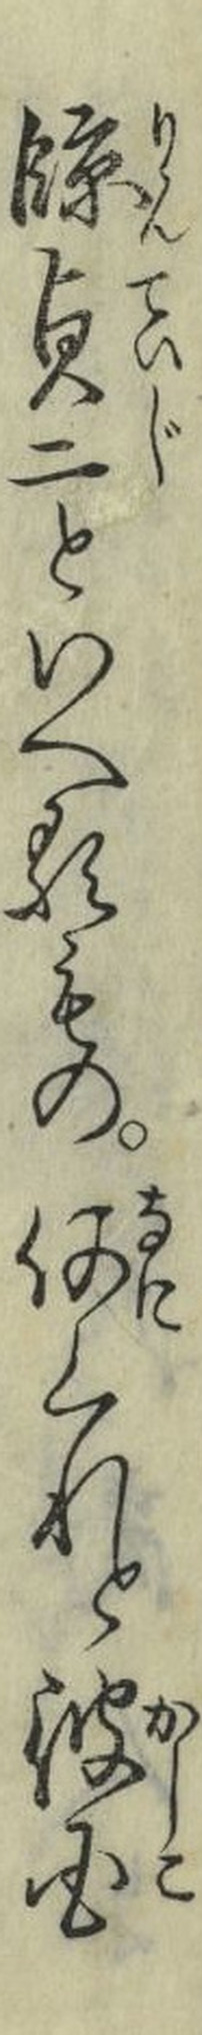臨貞二といへるもの。何くれと彼国
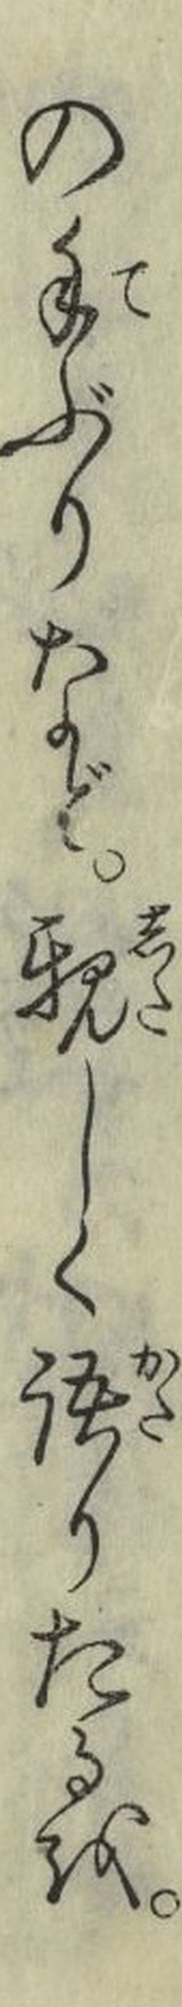の手ぶりなど。親しく語りたるを。
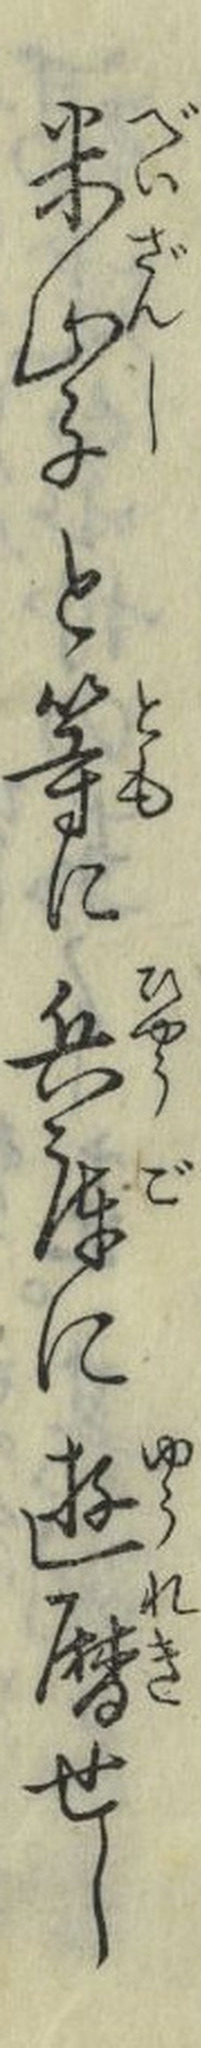米山子と等に兵庫に遊歴せし
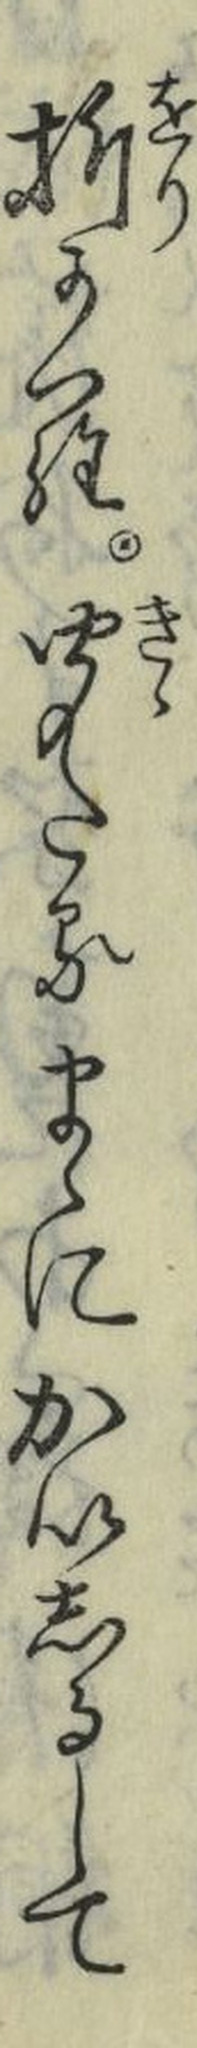折から。聞たるまゝにかいしるして
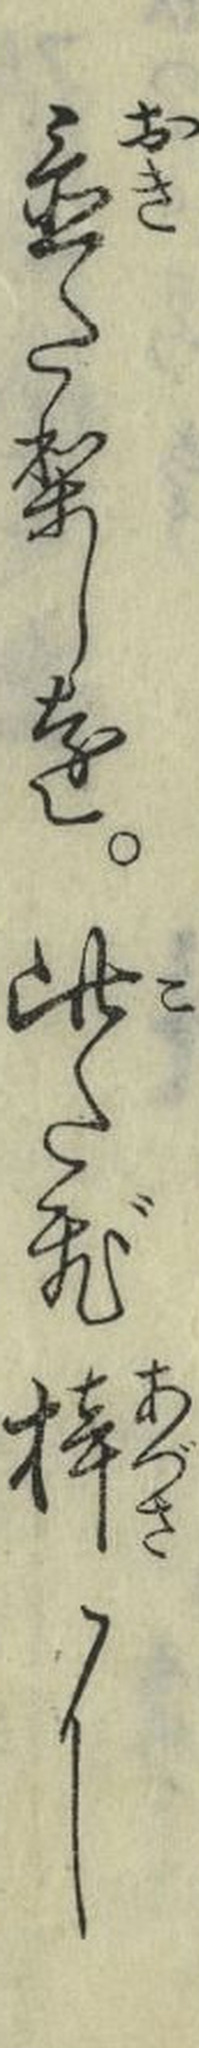置たりしを。此たび梓に
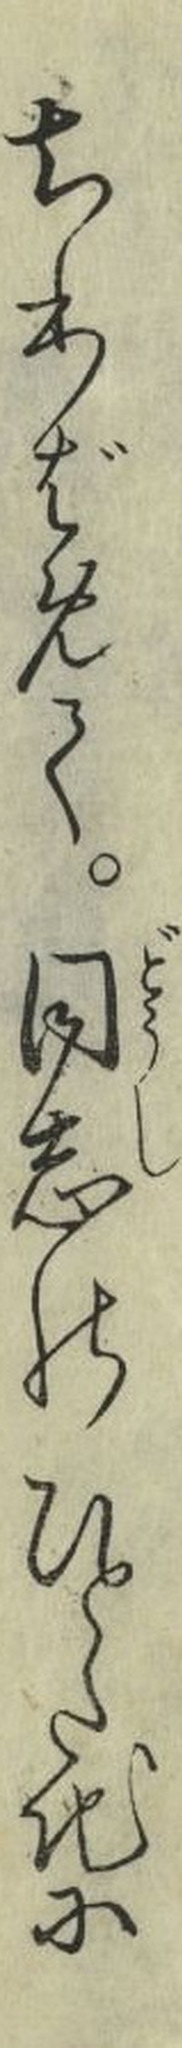ちりばめて。同志のひとたちに
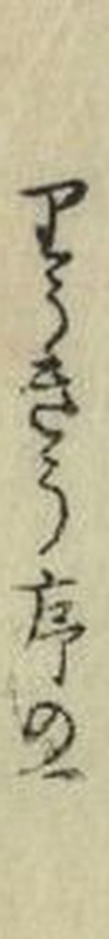りうきう序の一
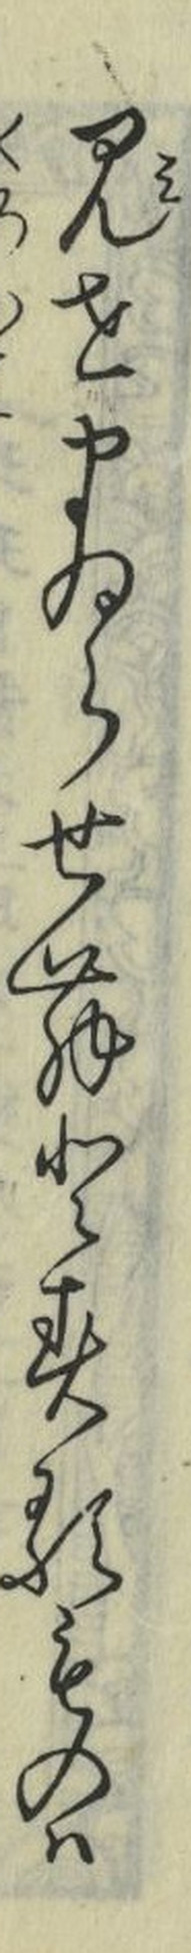見をまゐらせ前とするものは
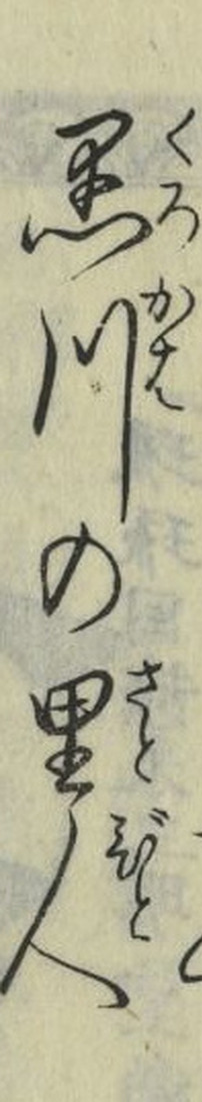黒川の里人
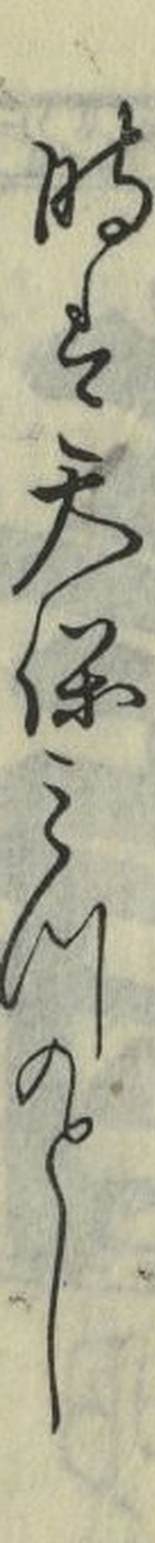時は天保みつのとし
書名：琉球奇譚
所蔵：University of the Ryukyus Library
